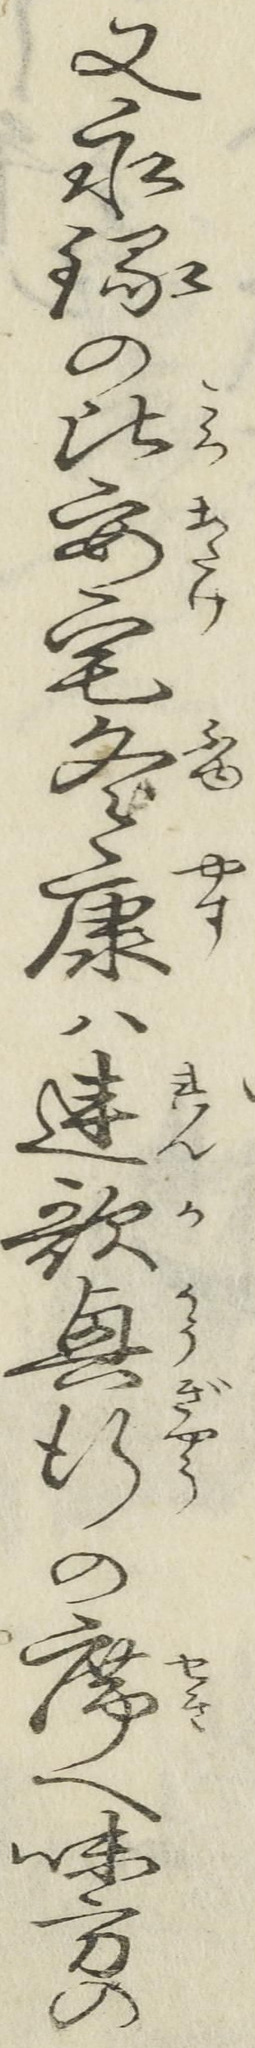又永禄の比安宅冬康は連歌興行の席へ味方の
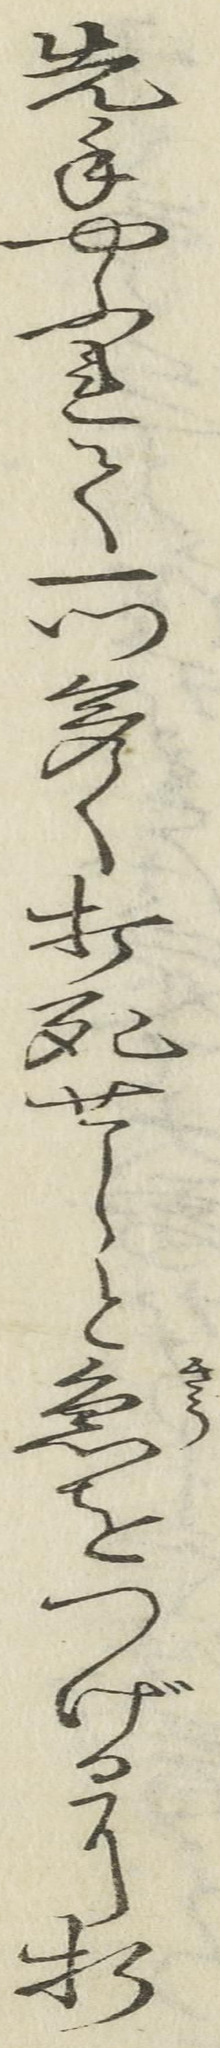先手やふれて一ッ多く打死せしと急をつげるに折
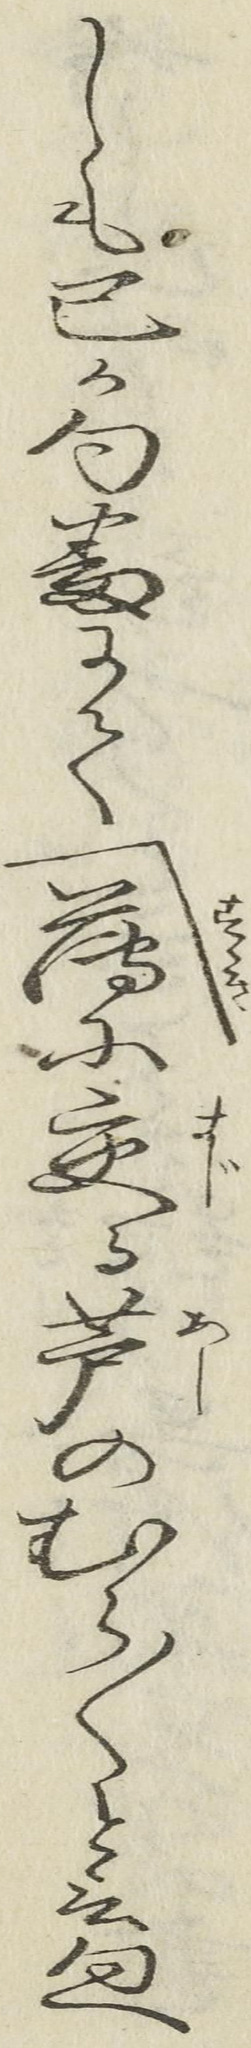しも己か句番にて「薄に交る芦のむら〳〵と云句へ
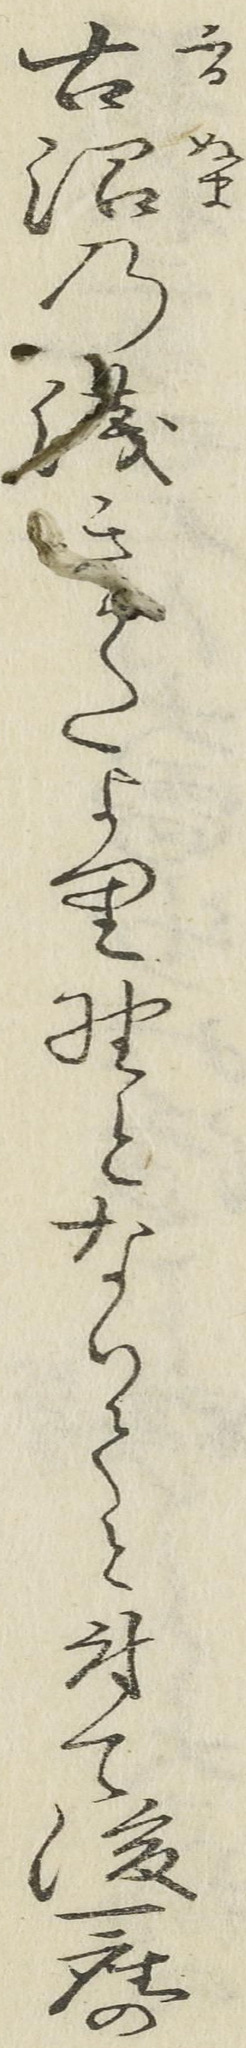古沼の浅きかたより野となりてと付て後一座の
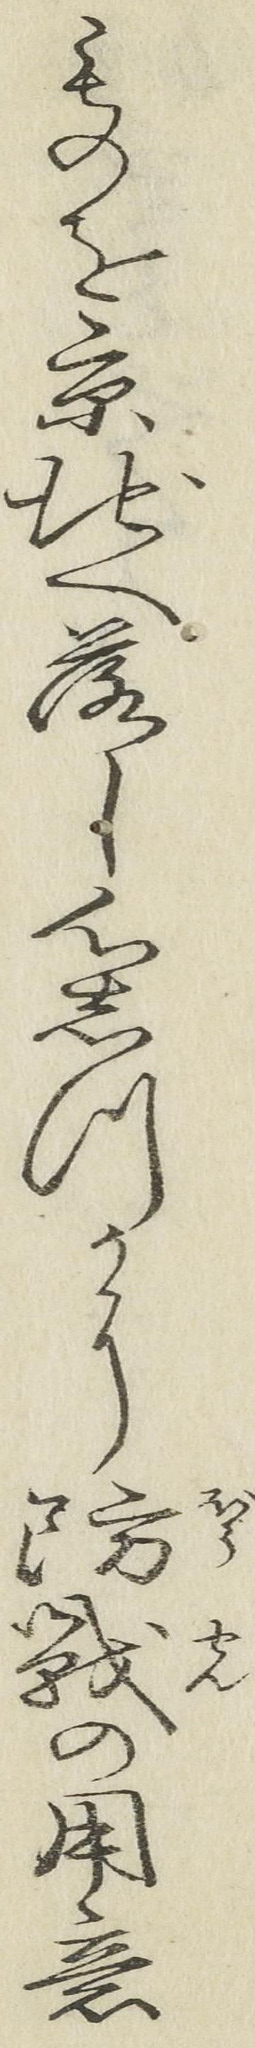ものを京地へ落し心しつかに防戦の用意
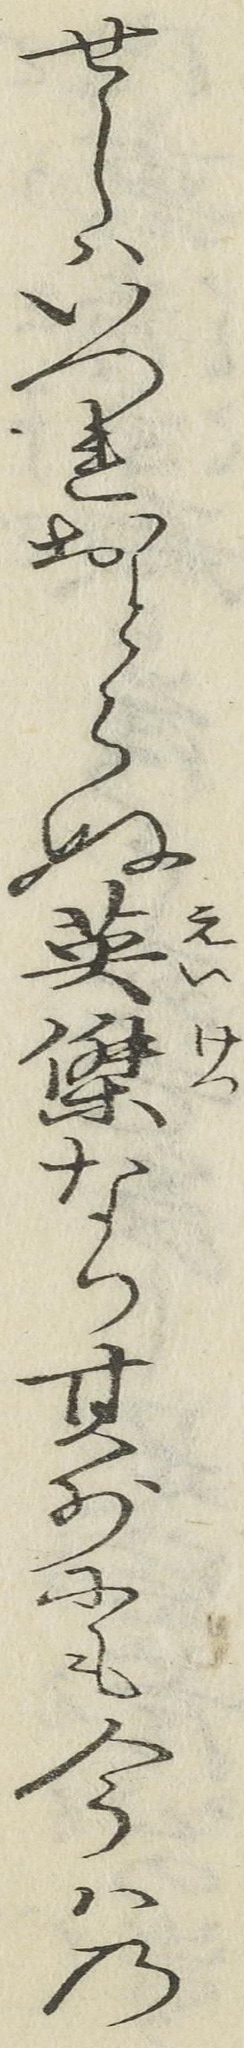せしはいつれおとらぬ英傑なり其外にも今はの
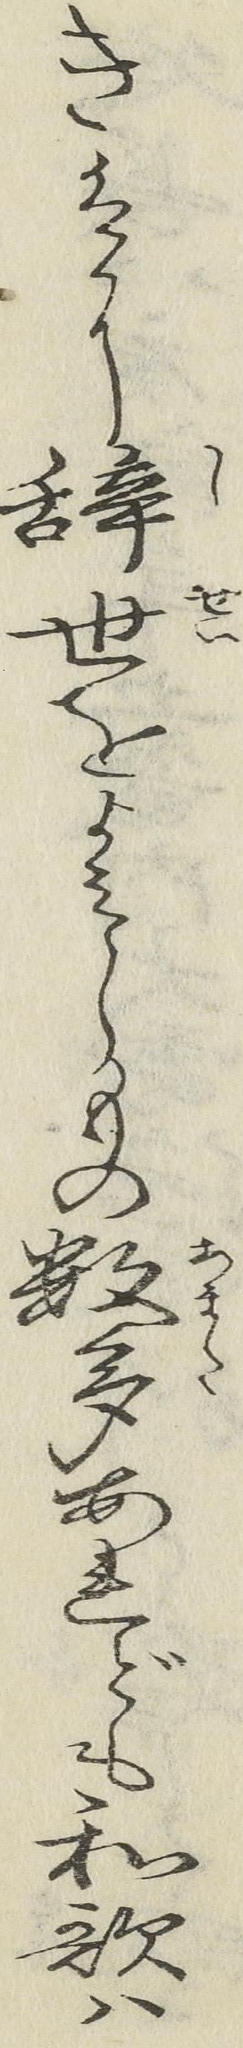きはに辞世をよみしもの数多あれども和歌は
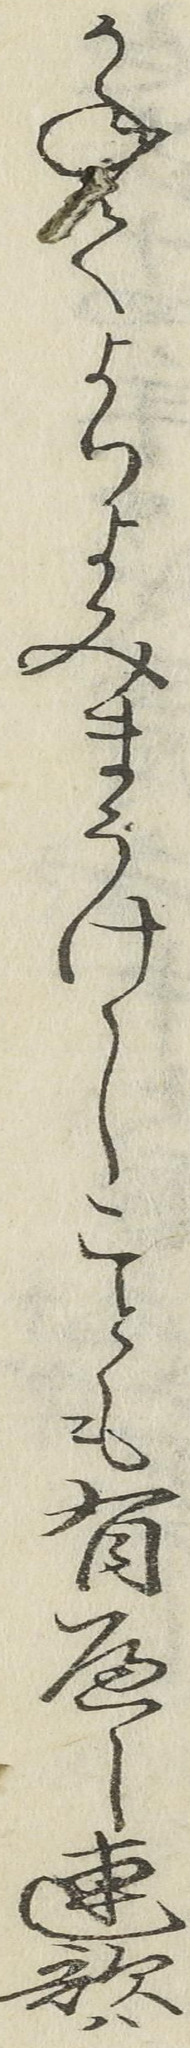かねてよりよみまうけしことも有へし連歌は
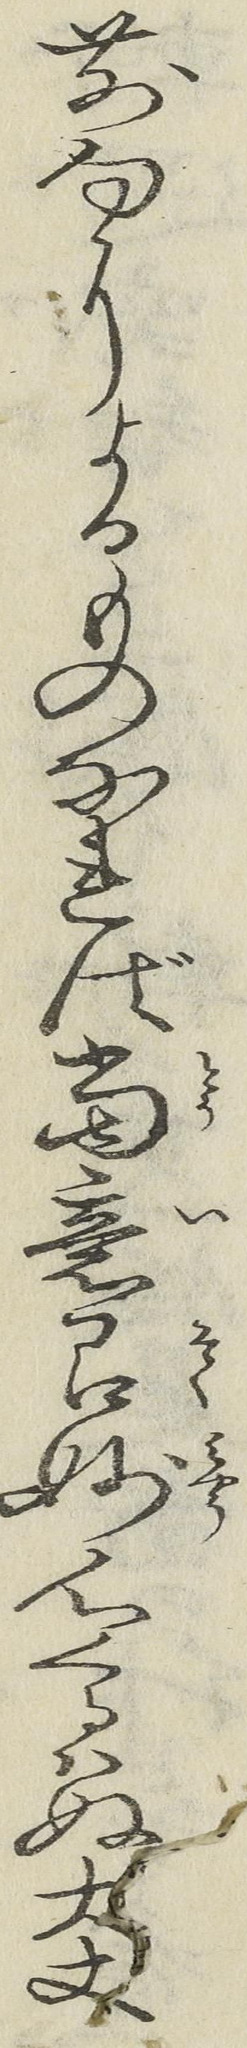前句によるものなれば当意即妙心くるはぬ大丈
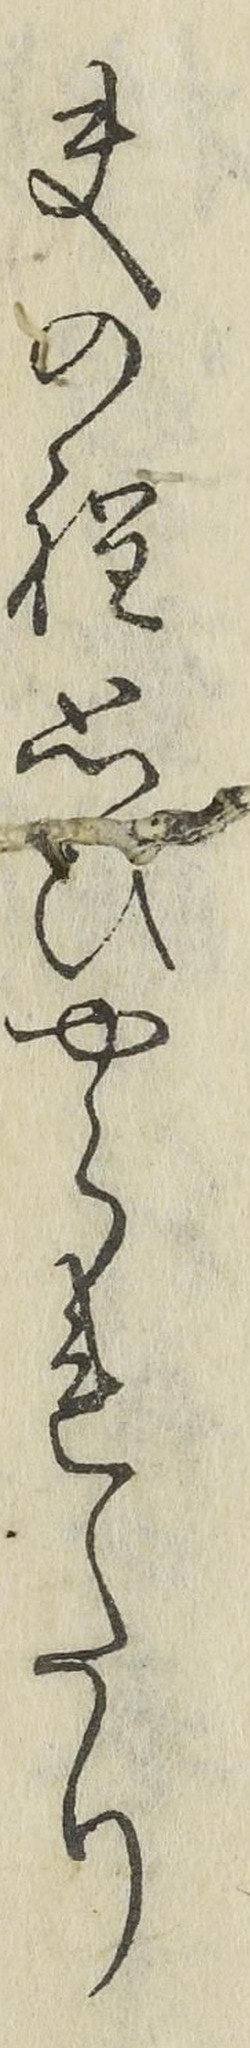夫の程思ひやられたり

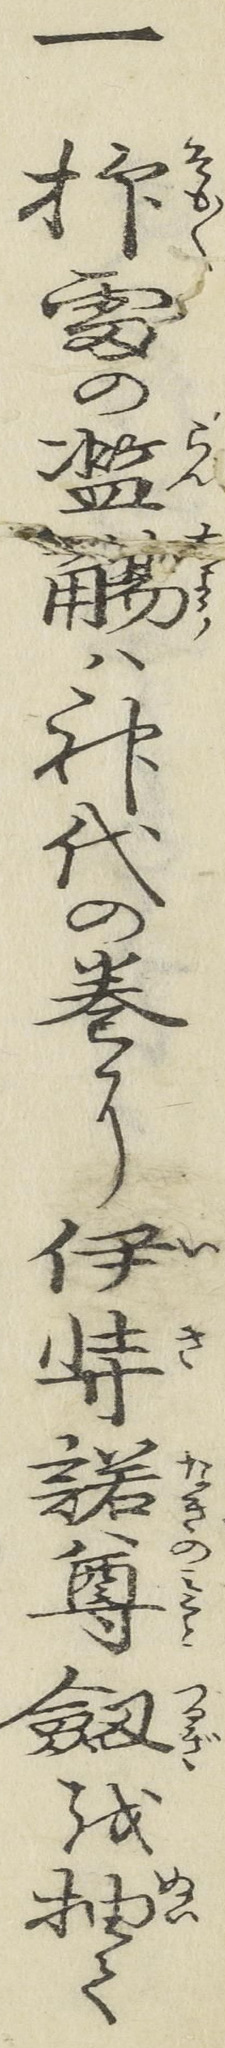一抑雷の濫觴は神代の巻に伊奘諾尊剣を抽て
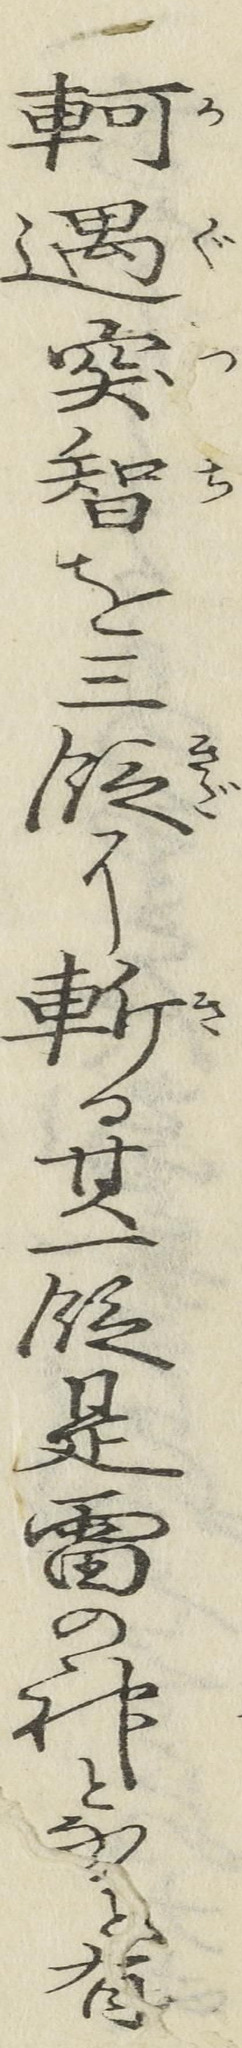阿遇突智を三段に斬る其一段是雷の神となると有
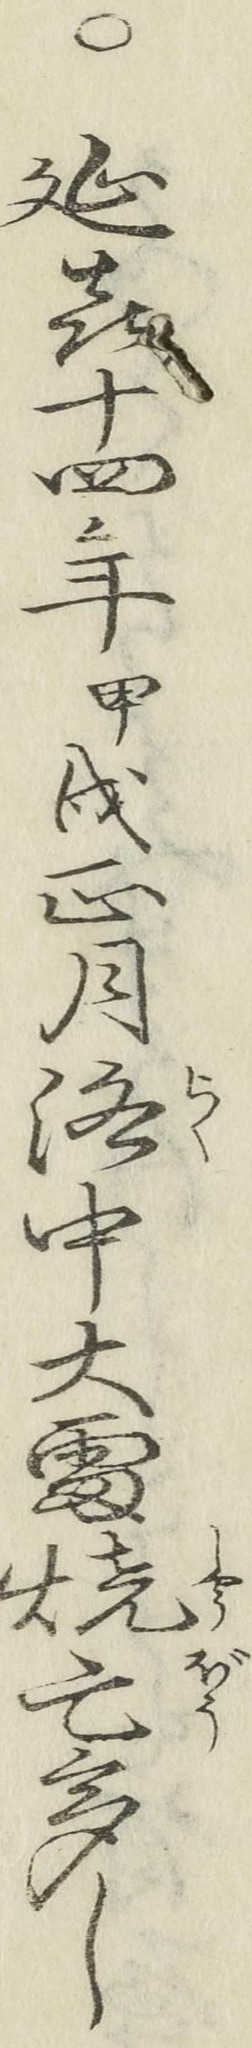〇延喜十余年甲戌正月洛中大雷焼亡多し
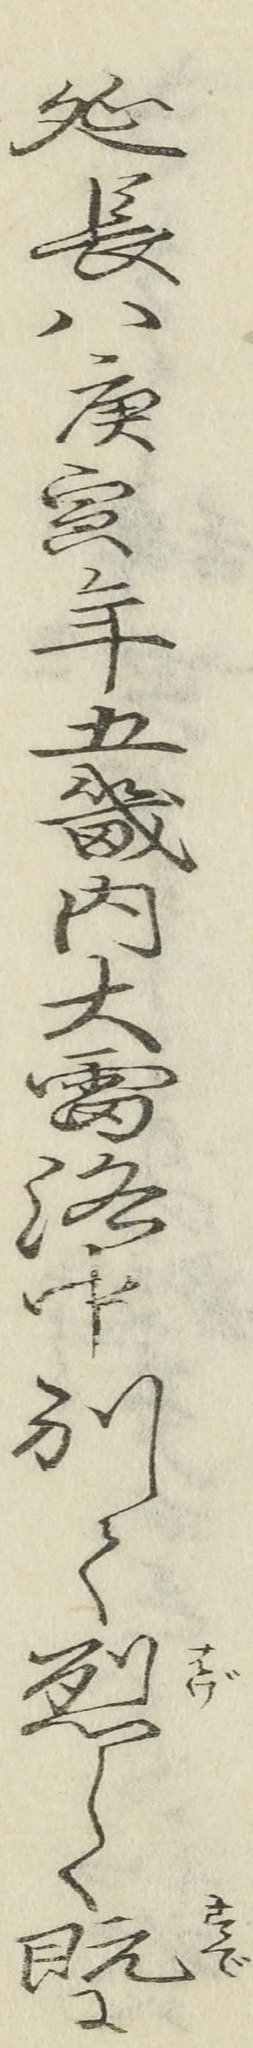〇延長八庚寅年五畿内大雷洛中別て烈しく既に
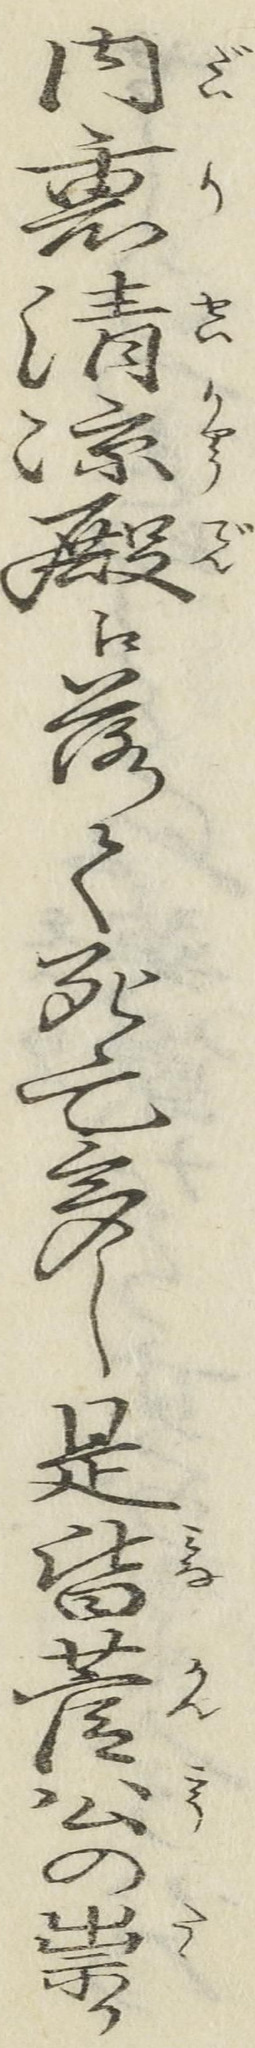内裏清涼殿江落て死亡多し是皆菅公の祟り
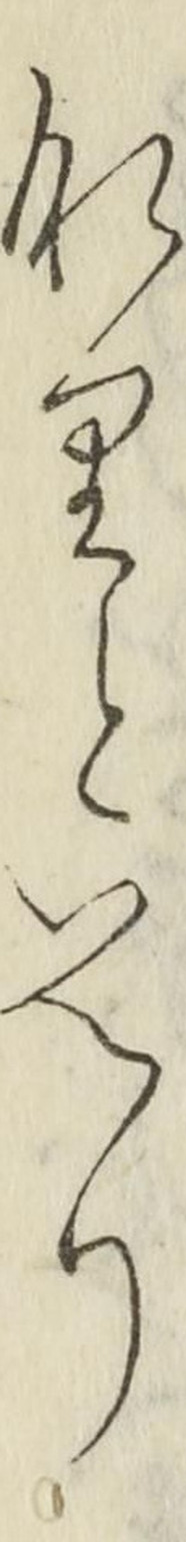なりといへり
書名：震雷考説　全
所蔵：東京大学地震研究所図書室 Earthquake Research Institute Library, The University of Tokyo, JAPAN
